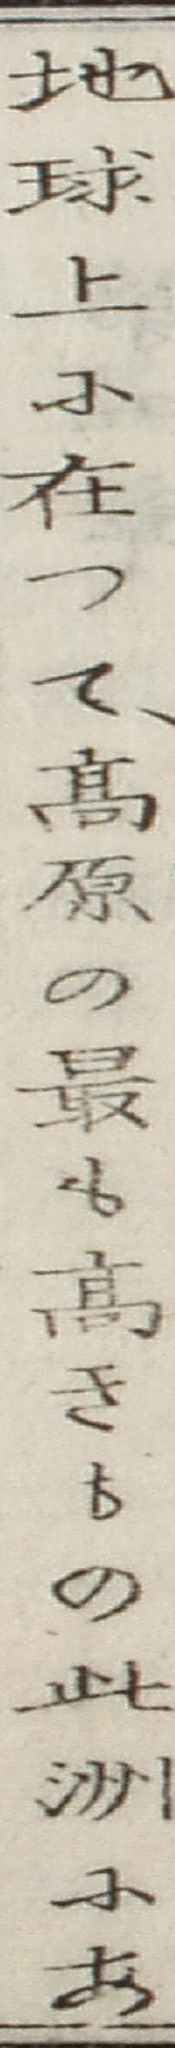地球上に在つて、高原の最も高きもの此洲にあ
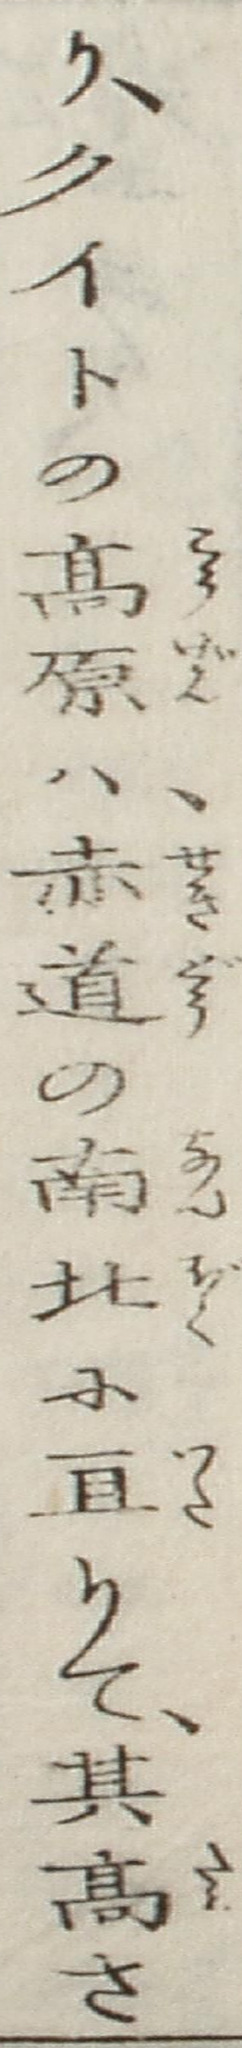り、クイトの高原は、赤道の南北に亘りて、其高さ
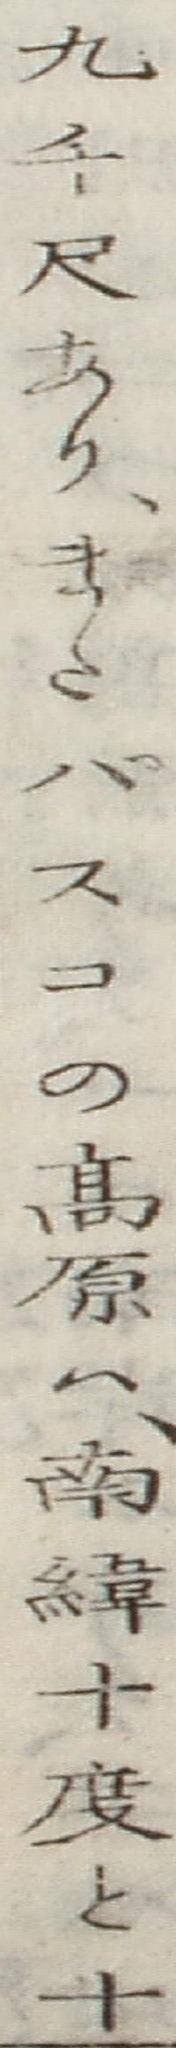九千尺あり、またパスコの高原は、南緯十度と十
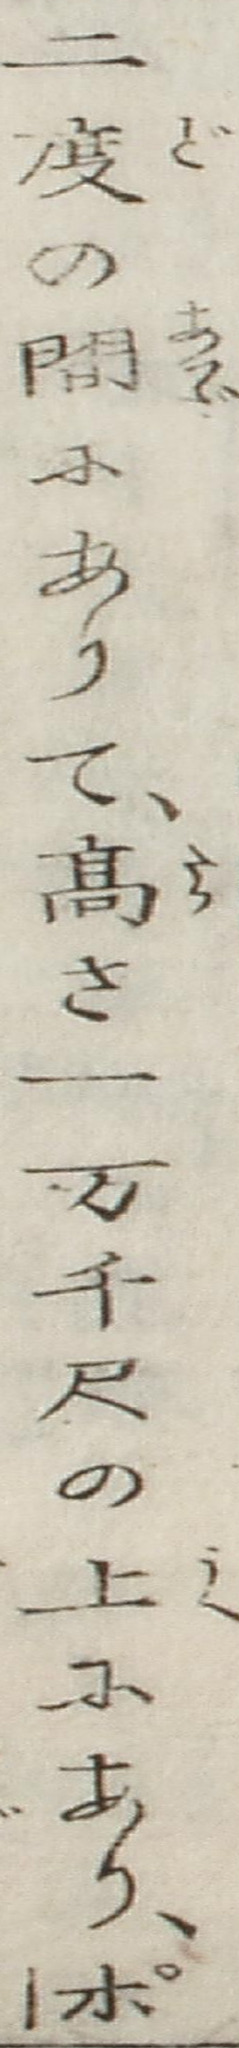二度の間にありて、高さ一万千尺の上にあり、ポ
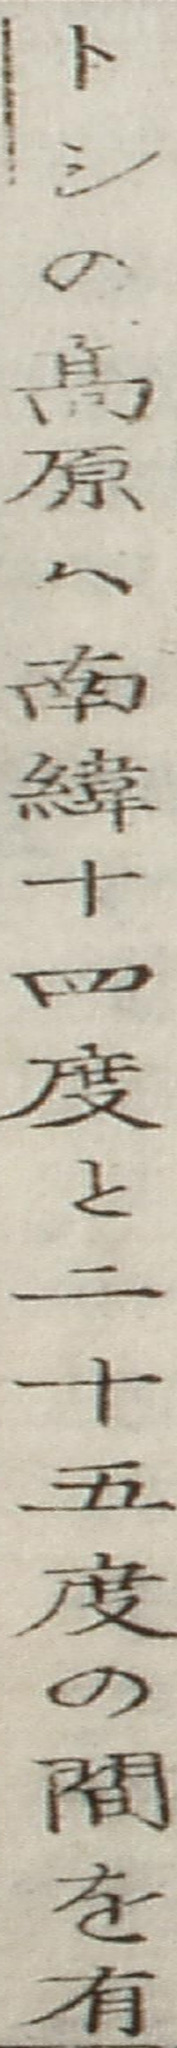トシの高原は、南緯十四度と二十五度の間を有

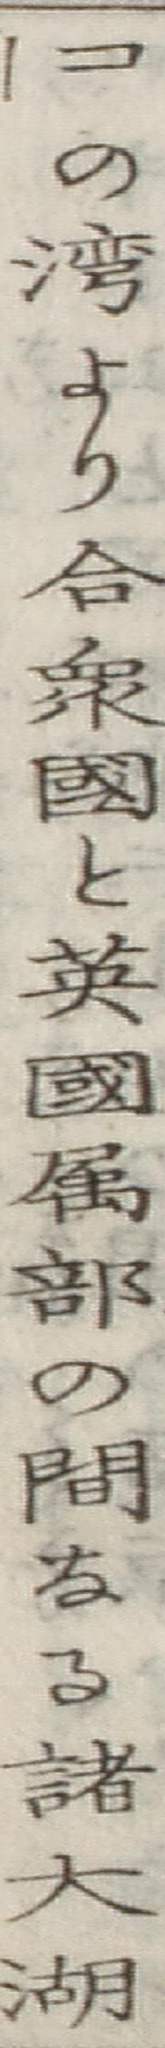コの湾より合衆国と英国属部の間なる諸大湖
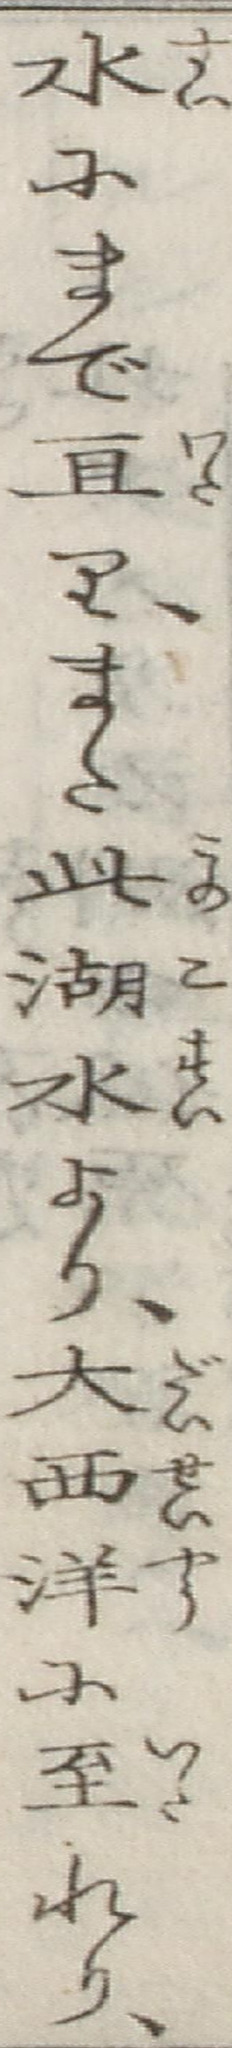水にまで亘り、また此湖水より、大西洋に至れり、
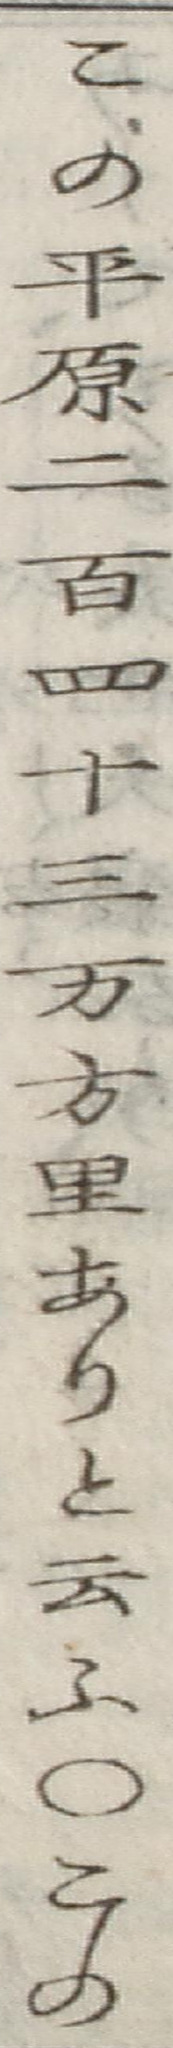この平原二百四十三万方里ありと云ふ、〇この
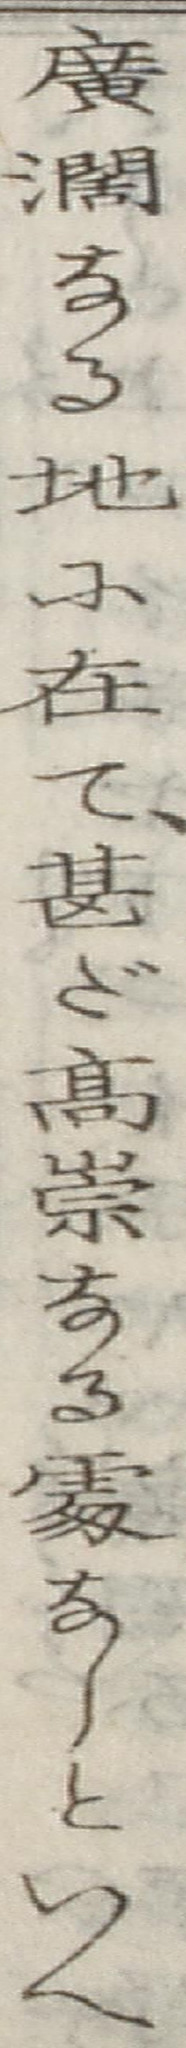廣濶なる地に在て、甚だ高祟なる処なしといへ
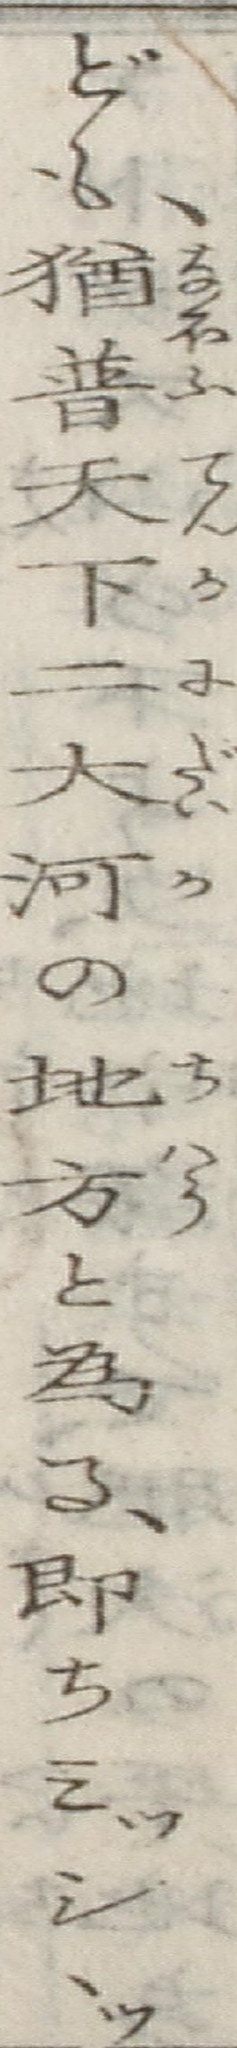ども、猶普天下二大河の地方と為る、即ちミッシシッ
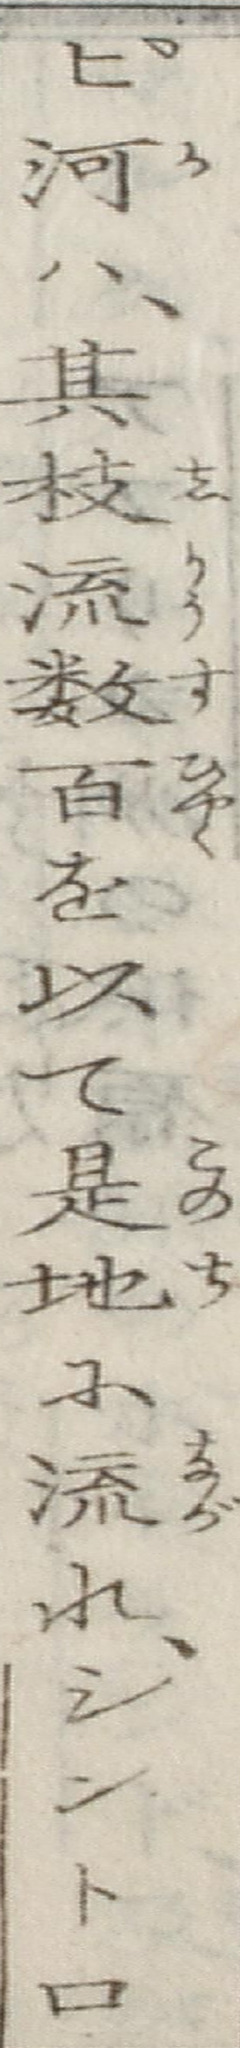ピ河は、其枝流数百をいて是地に流れ、シントロ
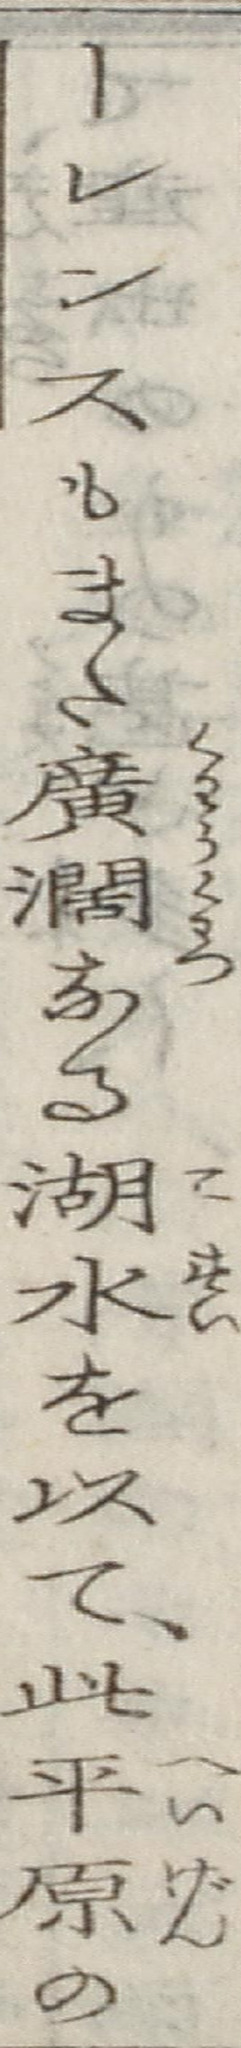ーレンスもまた廣濶なる湖水をいて、此平原の
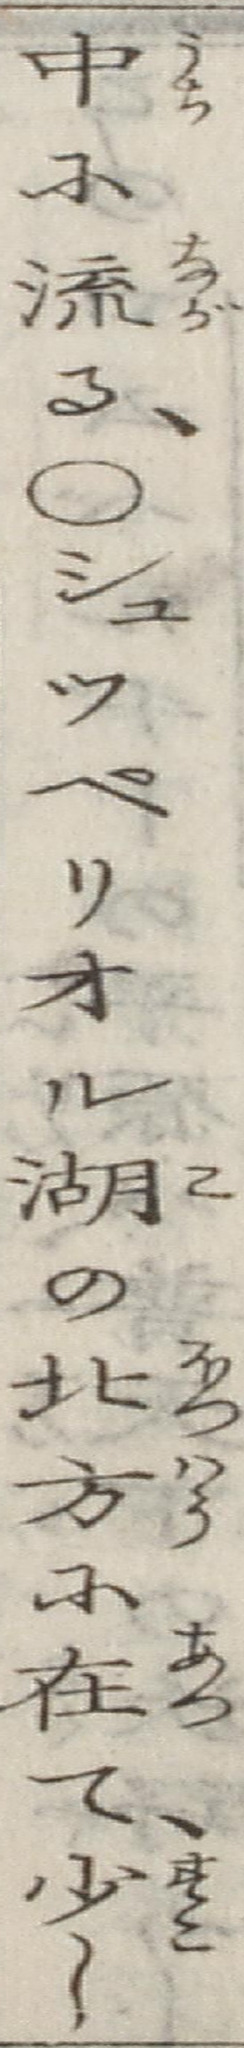中に流る、〇シュツペリオル湖の北方に在て、少し
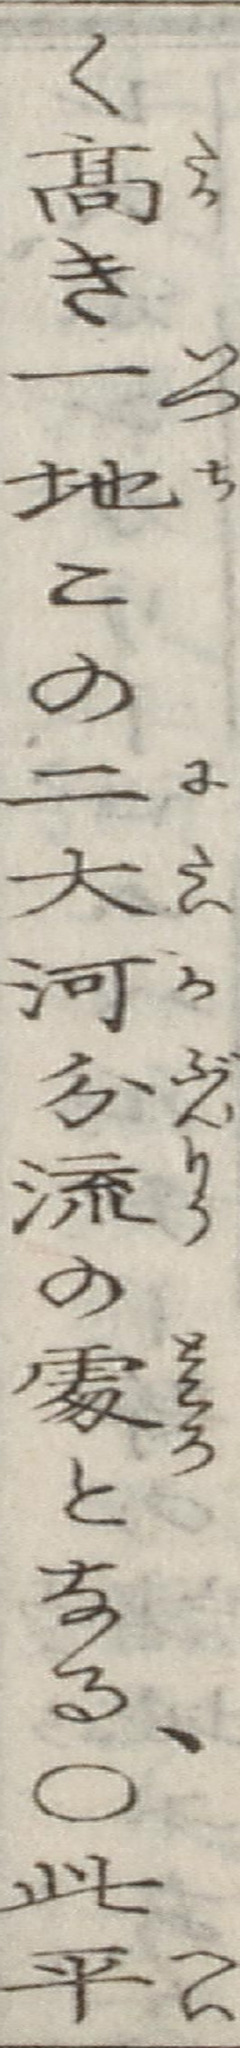く高き一地この二大河分流の処となる、〇此平
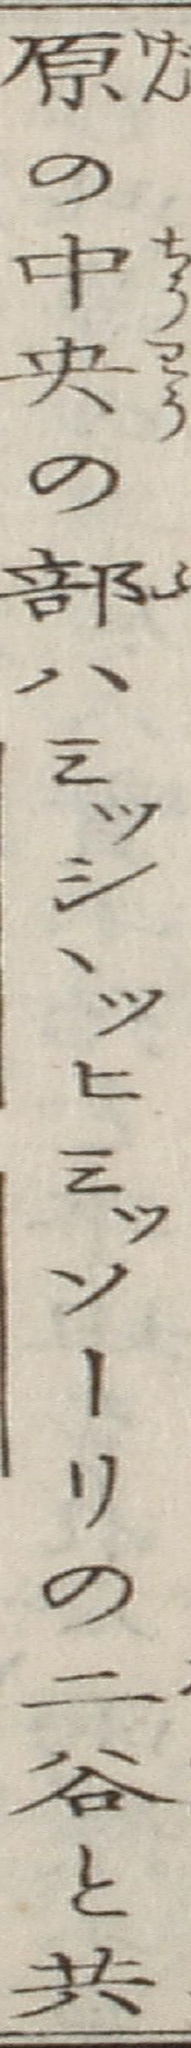原の中央の部はミッシシッヒミッソーリの二谷と共
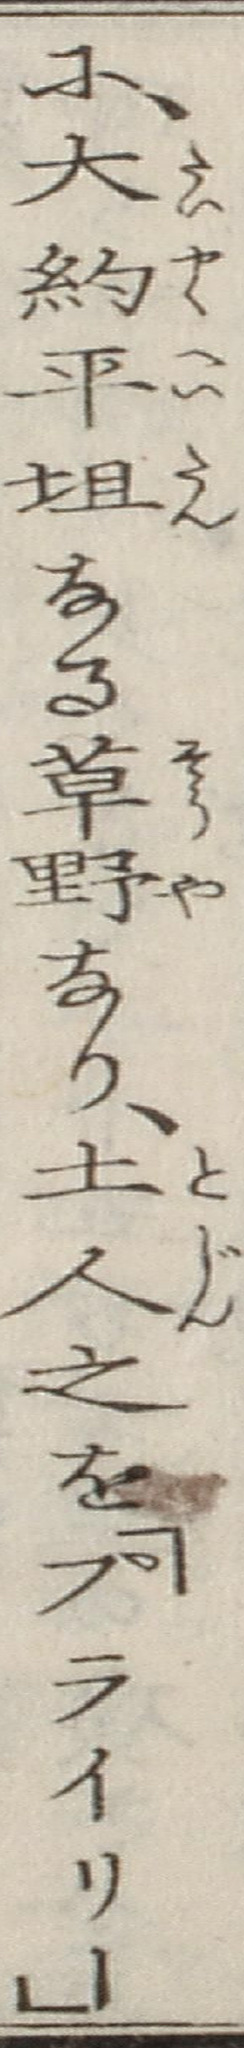に、大約平坦なる草野なり、土人之を「プライリー」
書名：訓蒙　天然地理學　上
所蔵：東京大学地震研究所図書室 Earthquake Research Institute Library, The University of Tokyo, JAPAN
